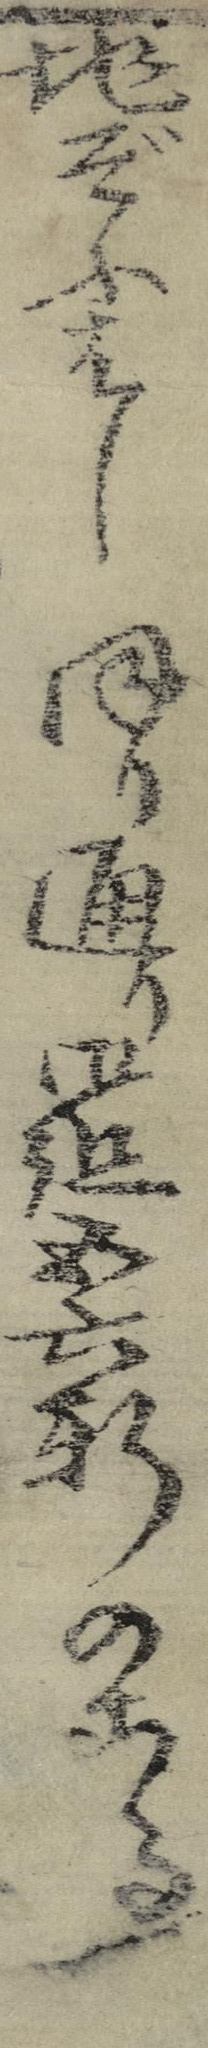地ぞふはし同り通り御組五六軒のこる
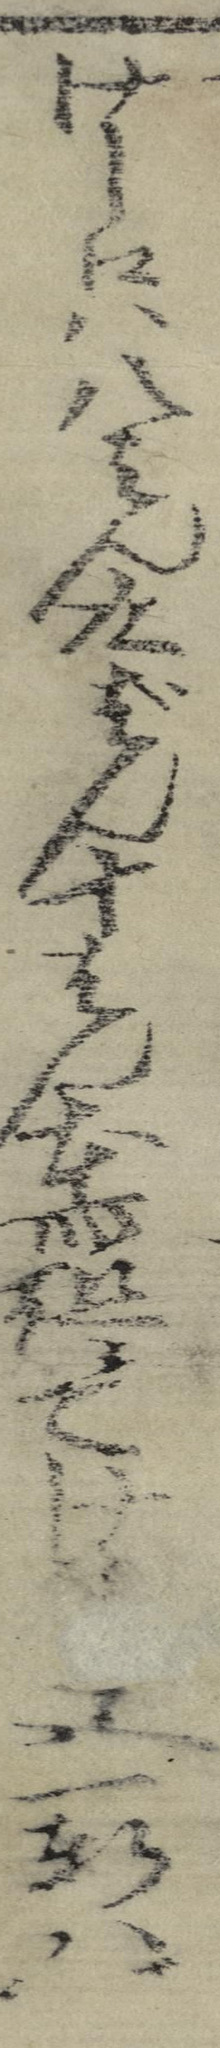けし口ハ八はん九ばん十はん本所組にてけ又一軒は
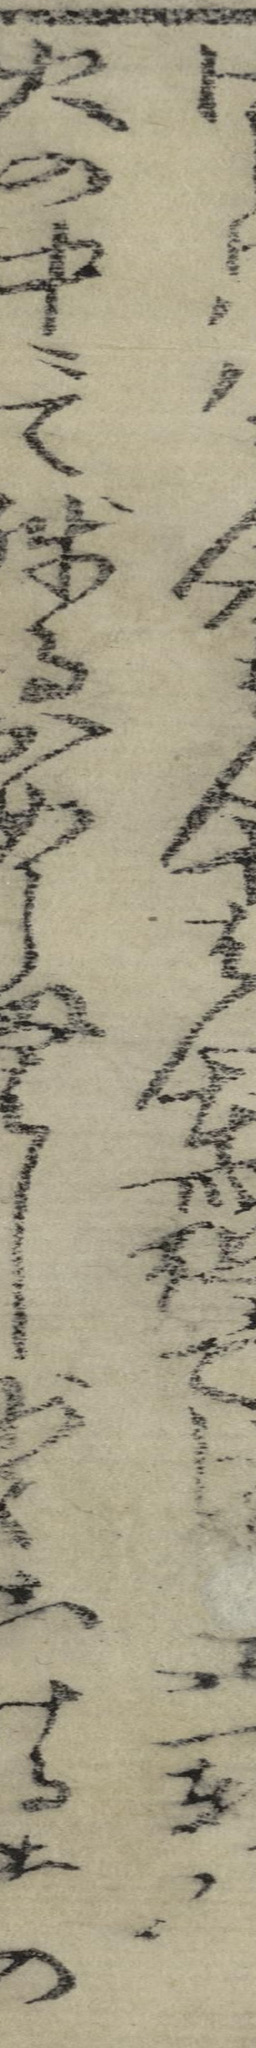火の中にて残るかめしまはし少〻こ？けるこの
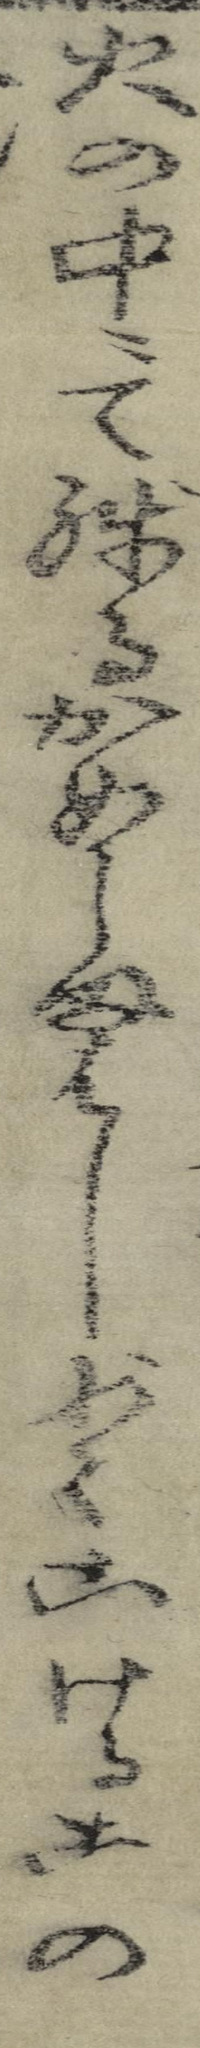火の中にて残るかめしまはし少〻こ？けるこの
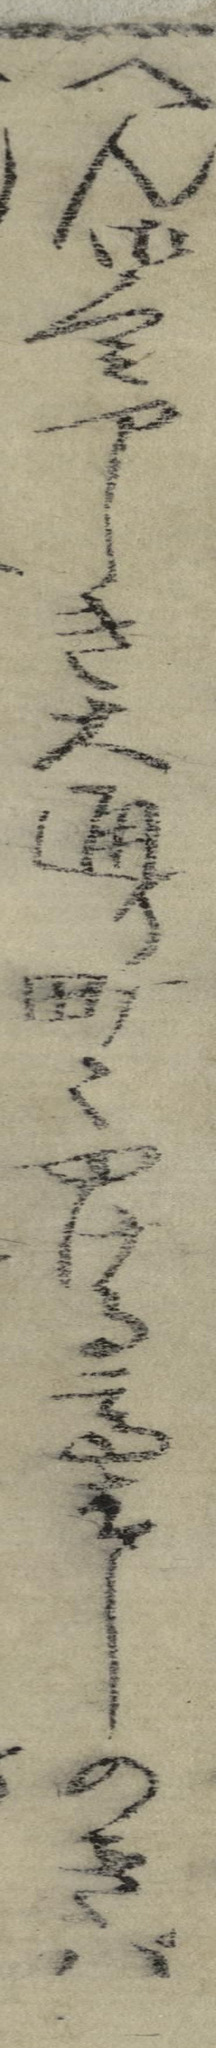へん御くみやしき大通り町〻やける寺はしのきは
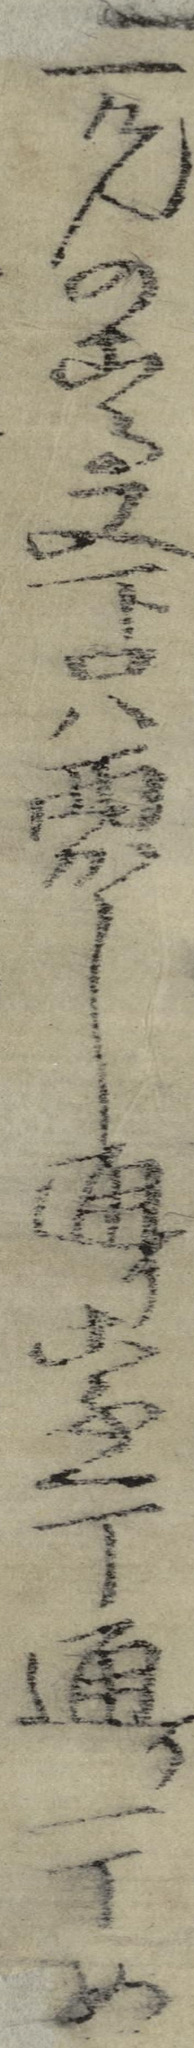一けんのこる又下口ハ西かし通りこふく丁通り一丁め
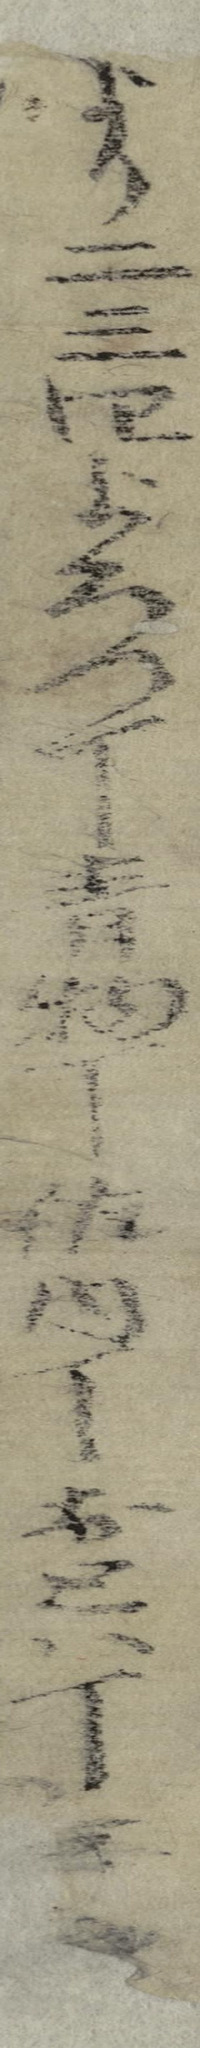よりニ三四よろつ丁青物丁佐？内丁おとハ丁
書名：[慶応二年十一月の江戸大火に関する瓦版]
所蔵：東京大学地震研究所図書室 Earthquake Research Institute Library, The University of Tokyo, JAPAN
